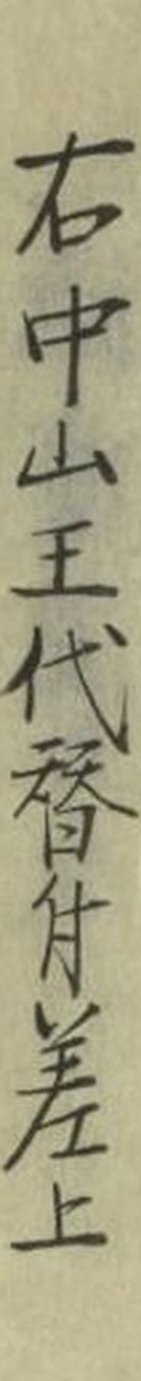右中山王代替付差上
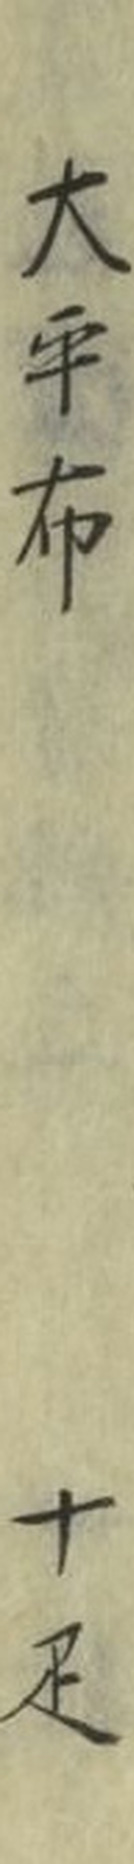大平布十疋
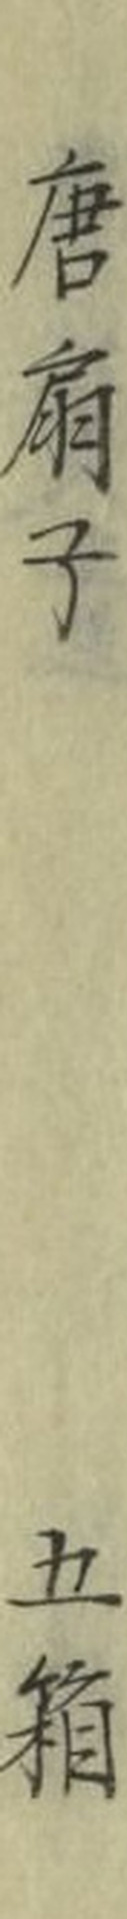唐扇子五箱
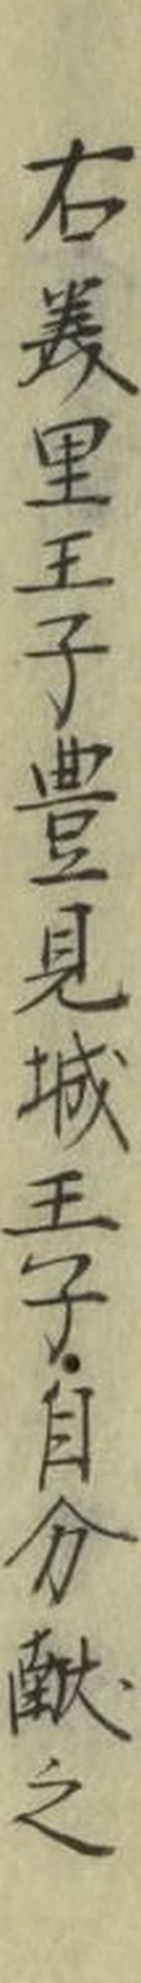右美里王子豊見城王子自分献上之
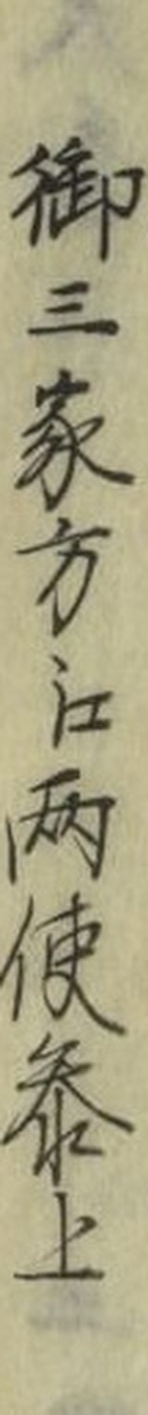御三家方え両使参上
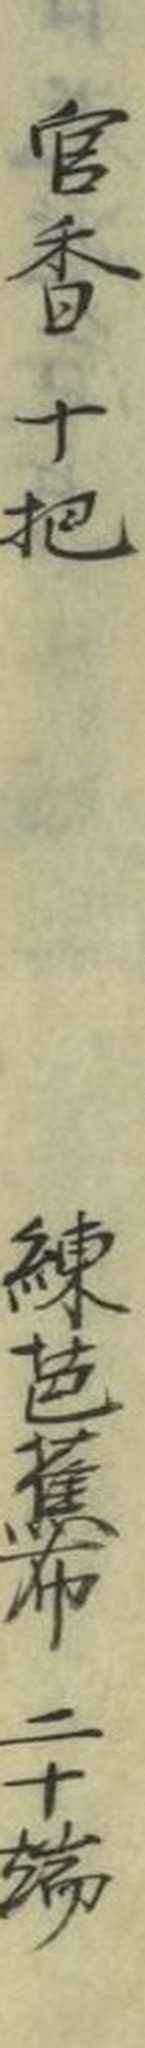官香十把練芭蕉布二十端
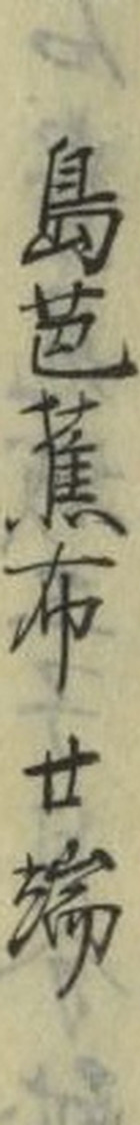練芭蕉布十端
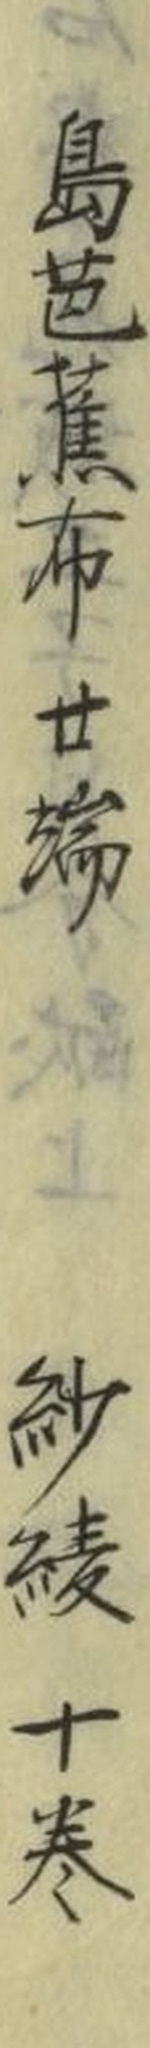島芭蕉布廿端紗綾十巻
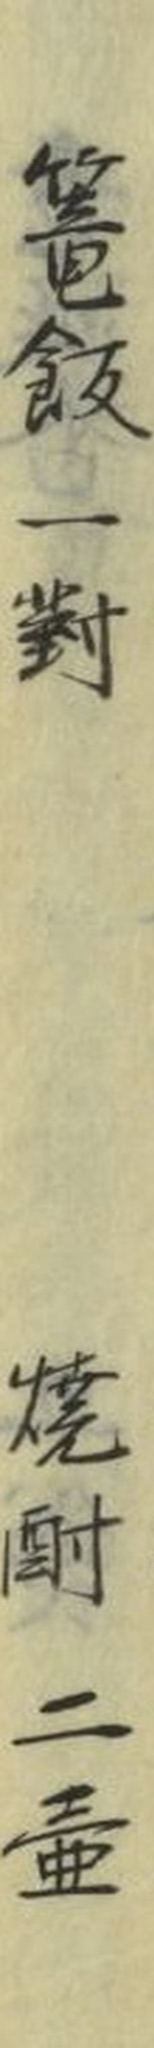篭飯一対焼酎二壺
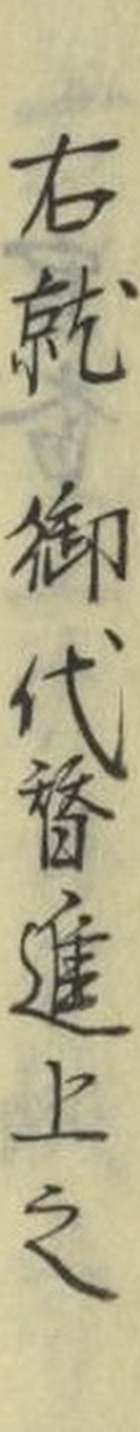右就御代替進上之
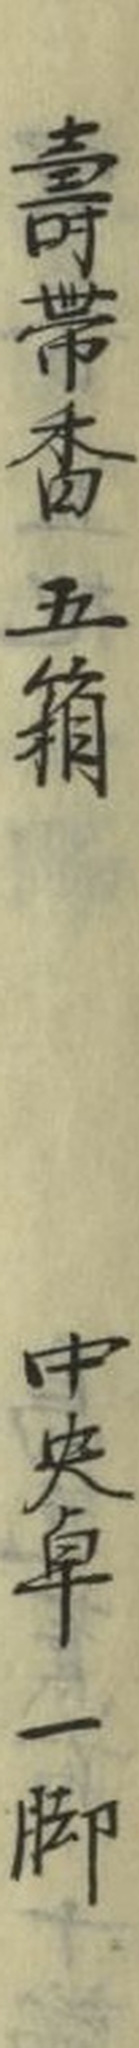寿帯香五箱中央卓一脚
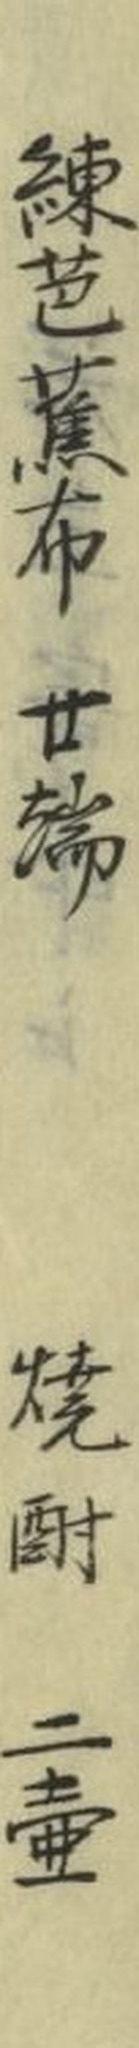練芭蕉布廿端焼酎二壺
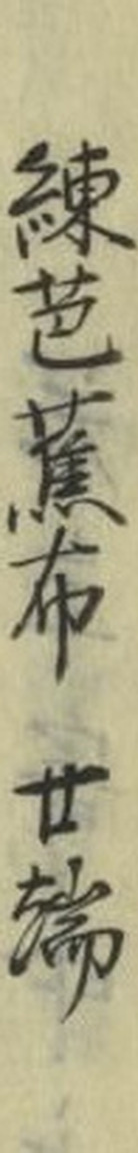練芭蕉布十端
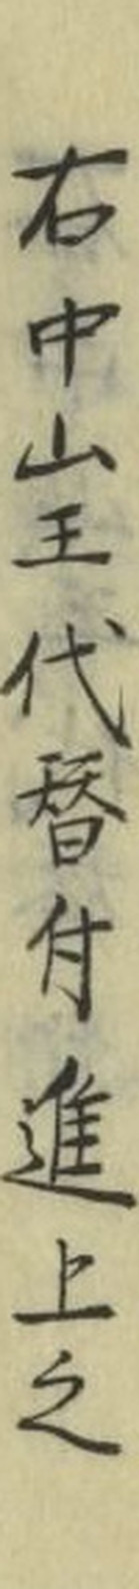右中山王代替付進上之
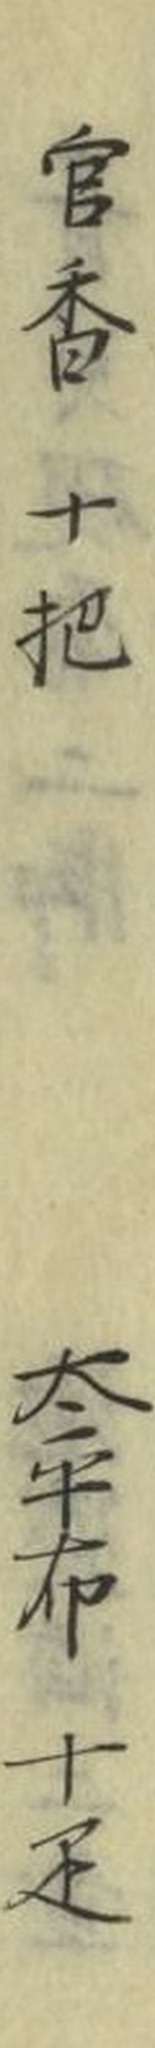官香十把太平布十疋
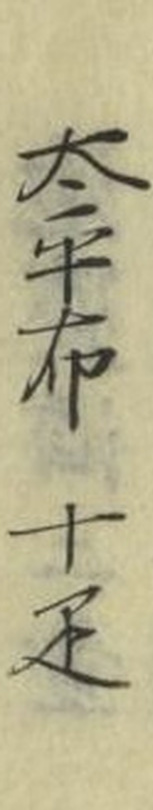大平布十疋
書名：宝永七庚寅年琉球国来聘使日記
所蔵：University of the Ryukyus Library
